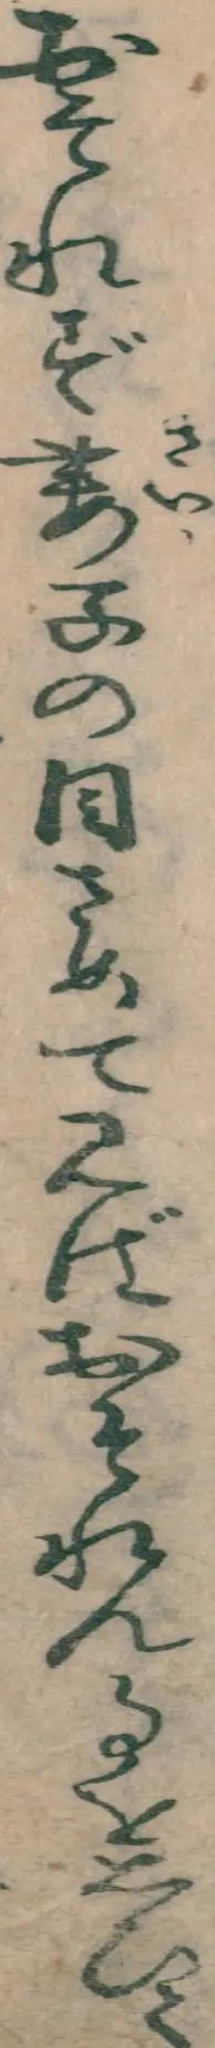おそれず妻子の目さめて見ばおそれん事を思ひて
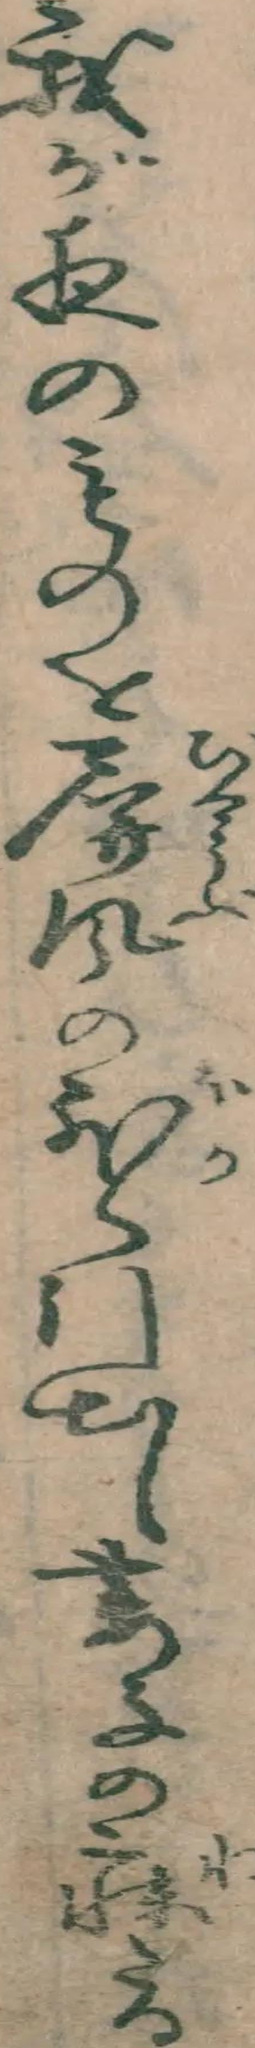我が夜のものを屏風の外へ引出し妻子の寝たる

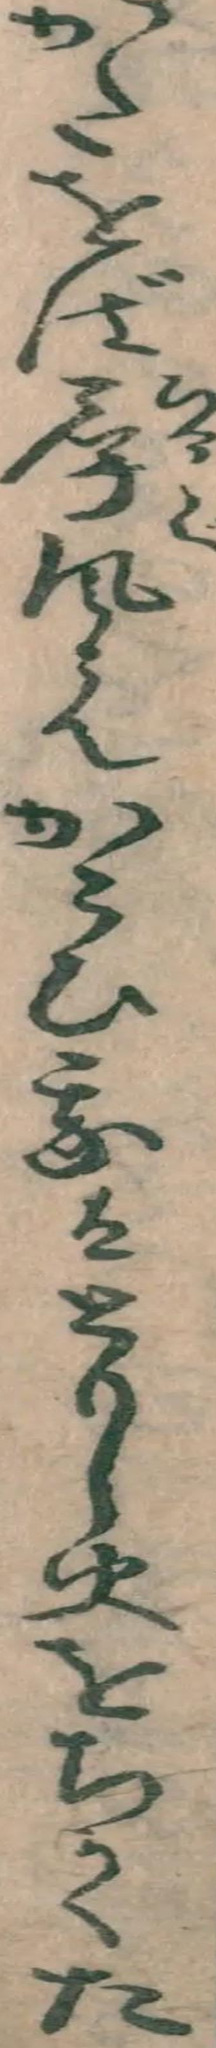かたをば屏風にてかこひ家はともし火をちかくた
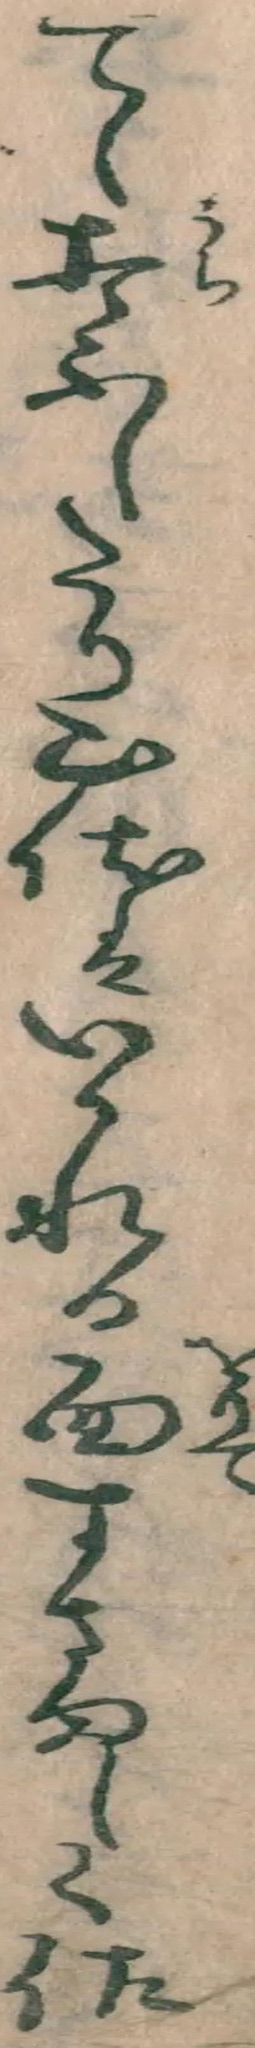てゝ打ふしたり山伏はいかれる面すさましく佐
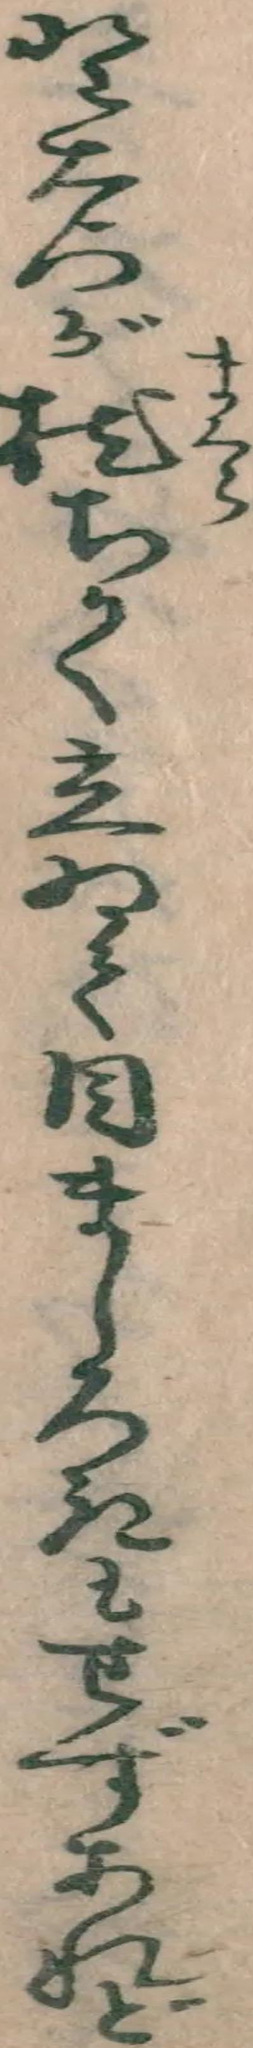野右衛門が枕ちかく立ゐて目ましろきもせずあれど
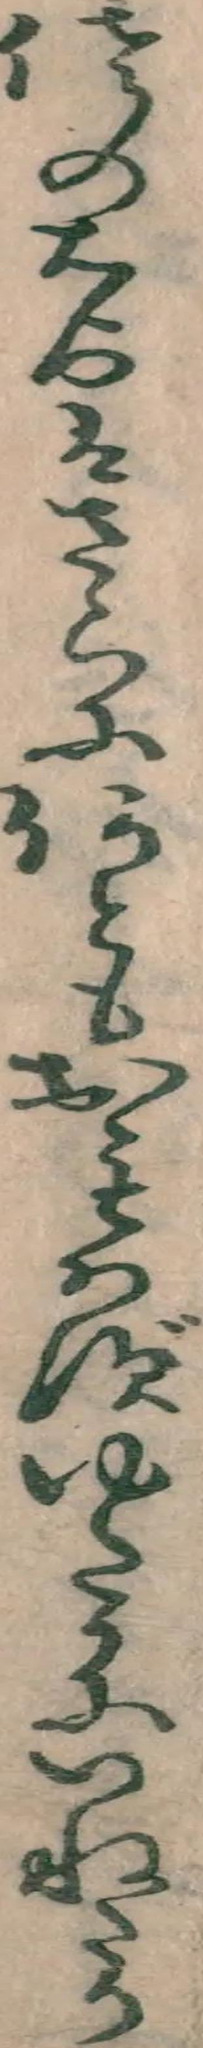佐の右衛門さらに何ともおもはずゆたかにいねたり
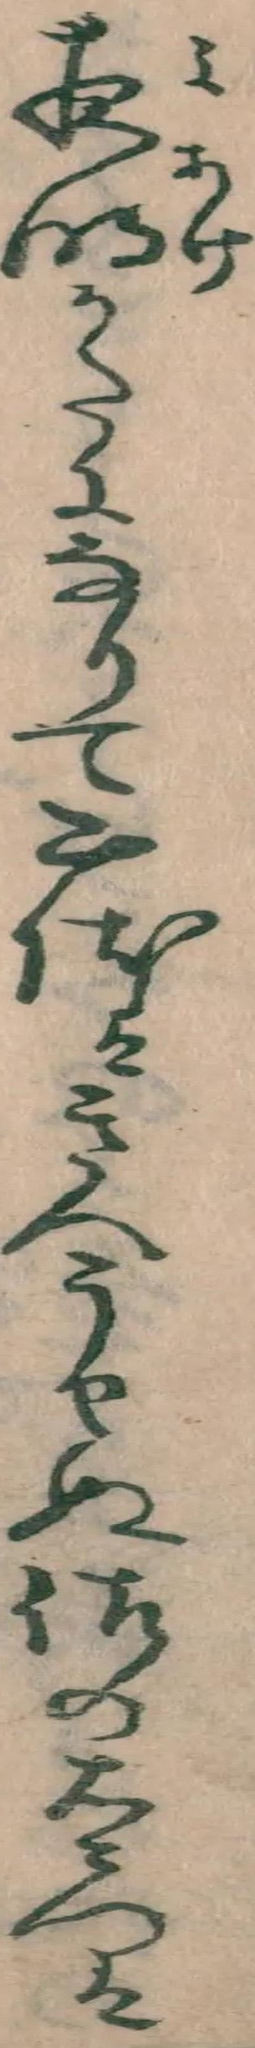夜明かたになりて山伏はきへうせぬ佐の右衛門
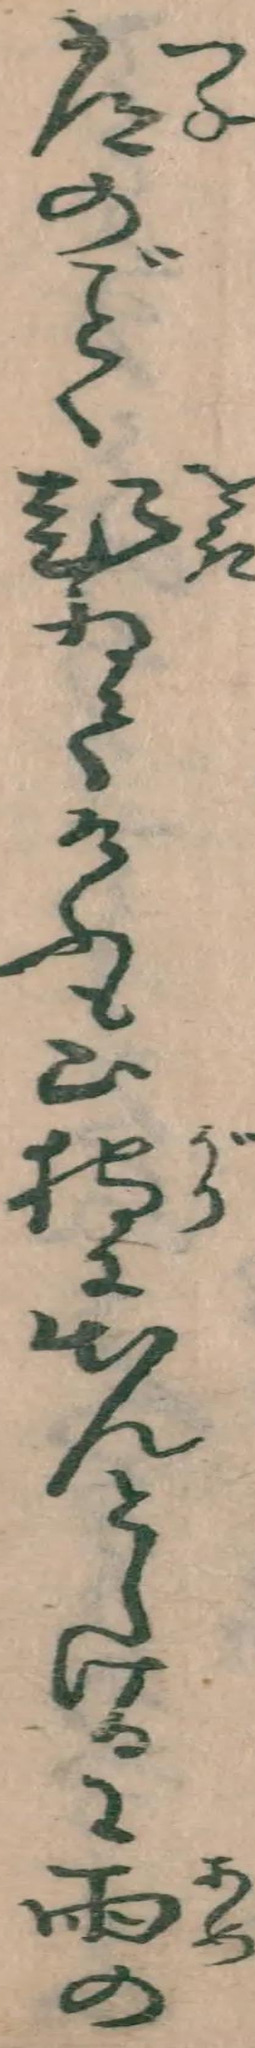常のごとく起ゐてけふも山狩に出んとしけるに雨の
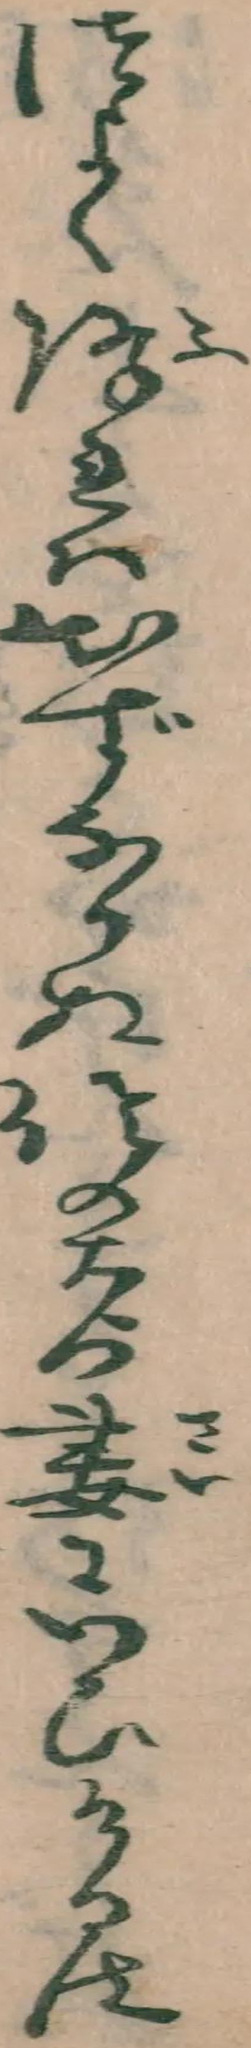つよく降れは出ずなりぬ佐の右衛門妻にわひけるは
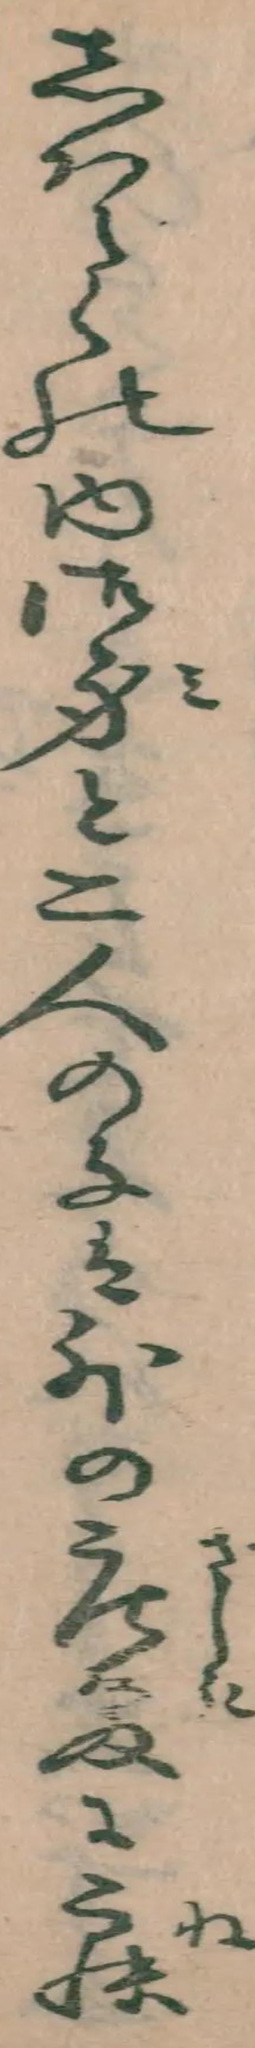しはらくの内御身と二人の子は外の座敷に寝
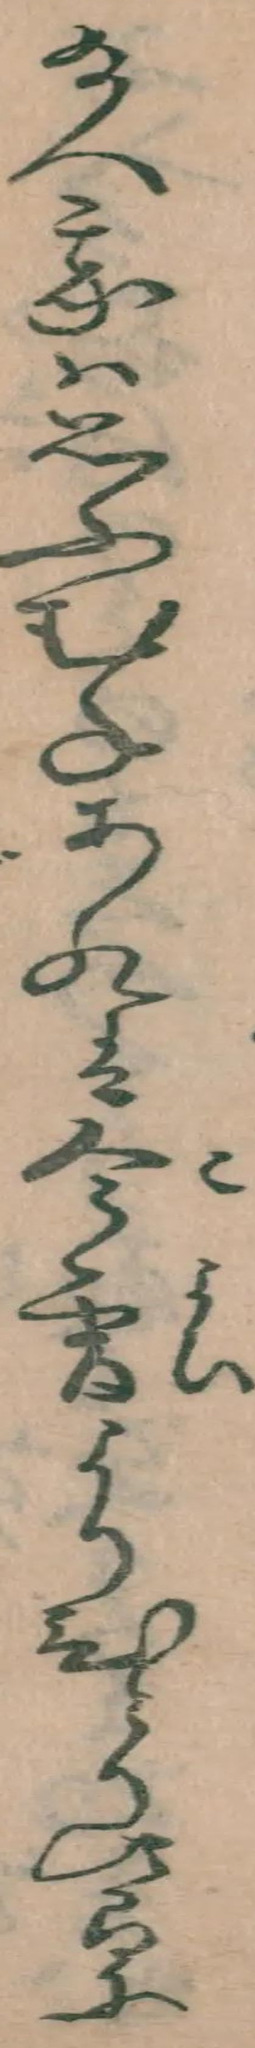給へ我は思ふむねあれは今宵よりひとりの間に
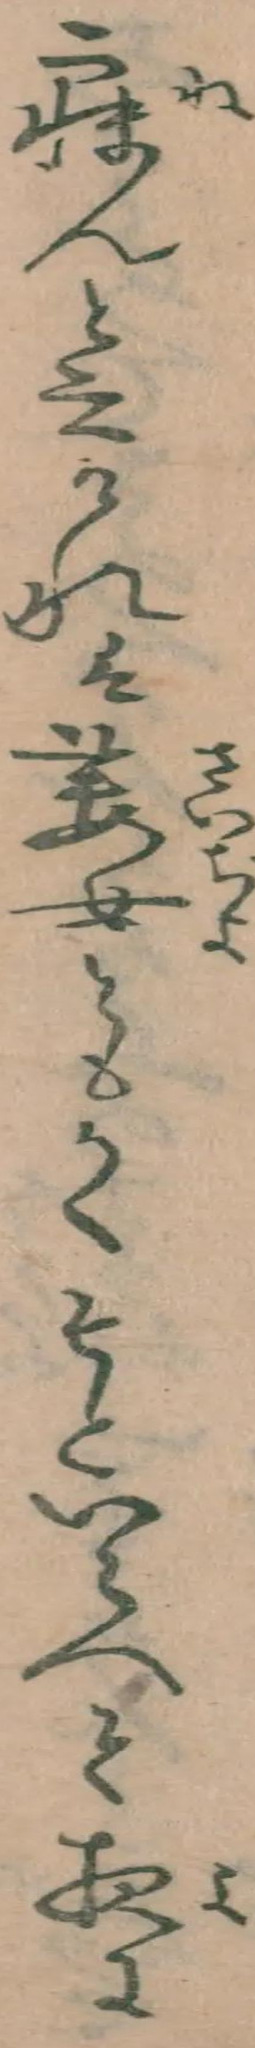寝んと云けれは妻女ともかくもといらへて夜に
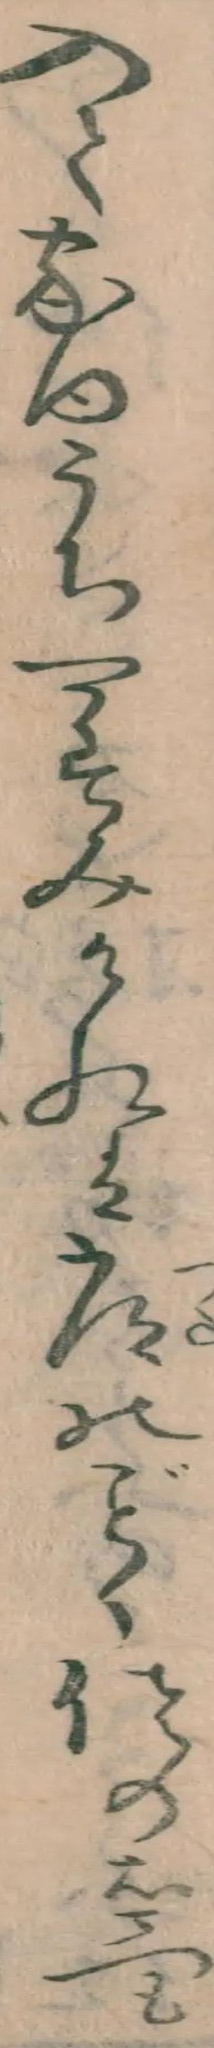入て家内うちやすみけれは常のごとく佐の右衛門も
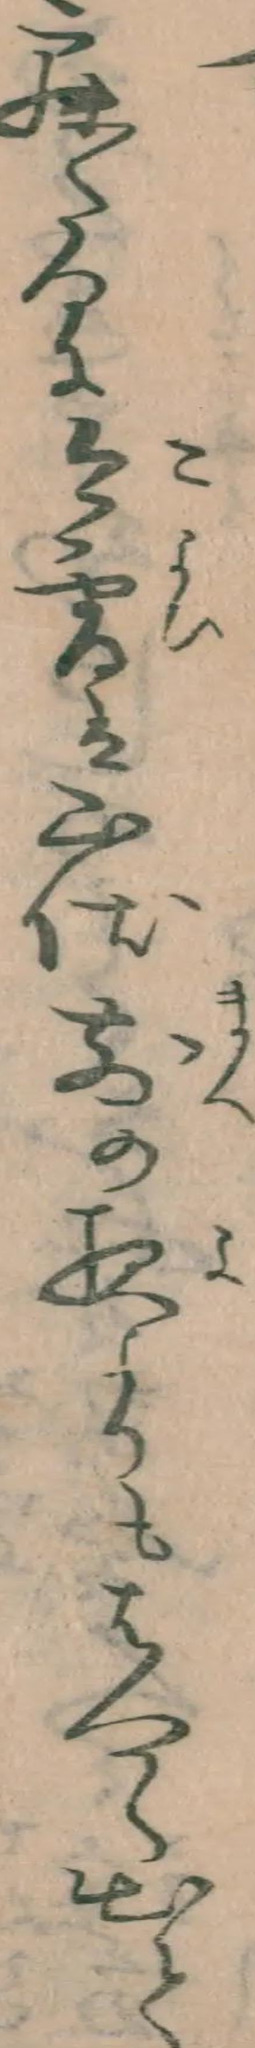寝たるに今宵は山伏前の夜よりもはやく出て
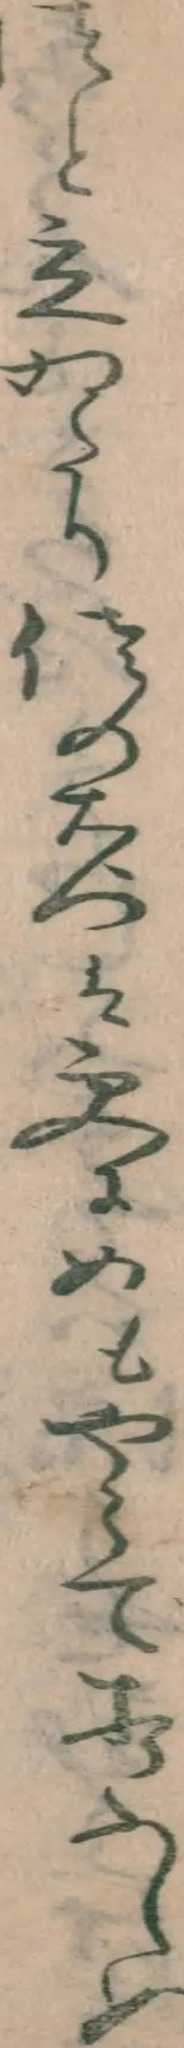つと立ゐたり佐の右衛門は更にめもやらで打ふしぬ
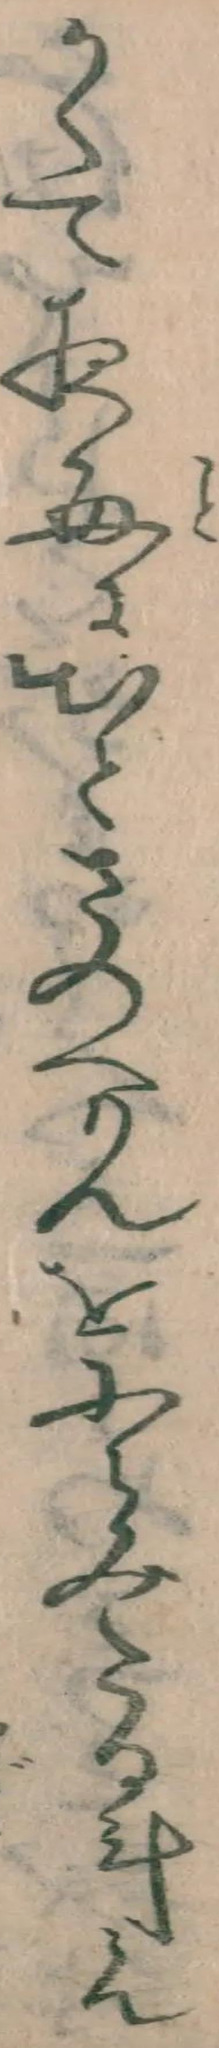かくて夜毎に出てさのへもんをおにらみたる斗にて
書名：怪談御伽童 5巻. [2]
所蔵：国立国会図書館 National Diet Library, JAPAN
